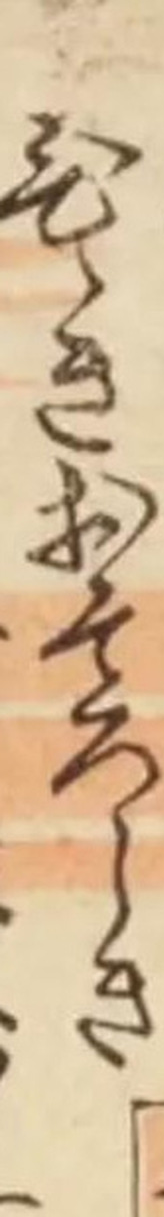ひゝきおそろしき
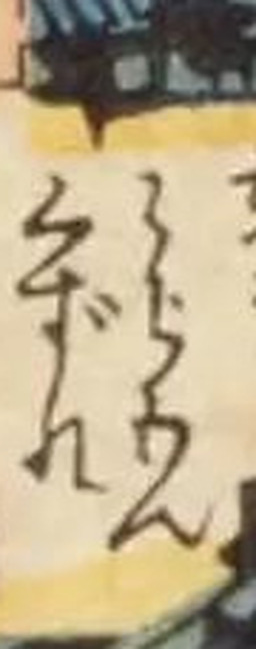くずれ
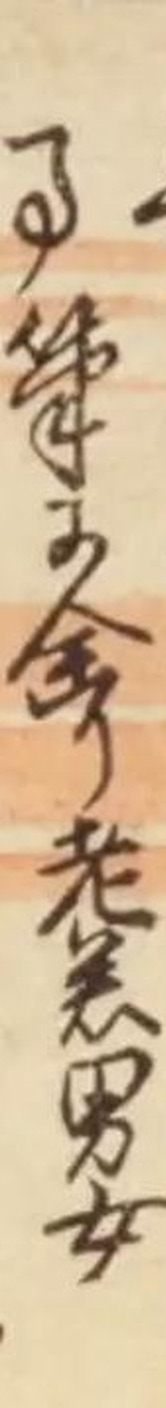事筆に余り老若男女
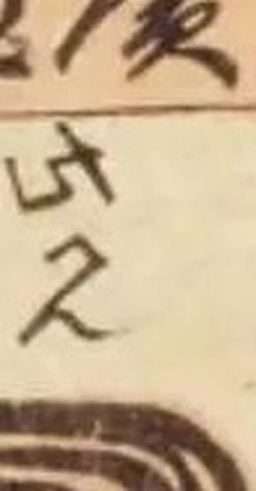此へん
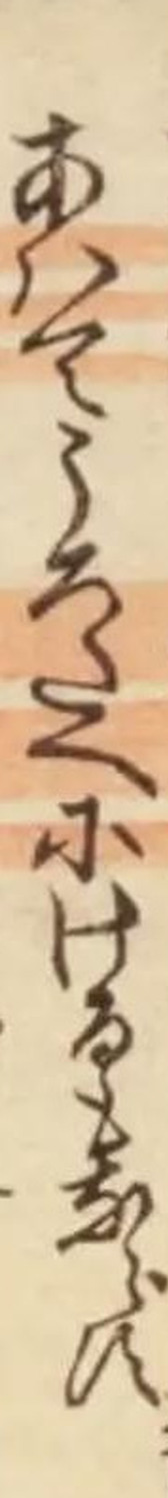あはてうろたへにけるもならす
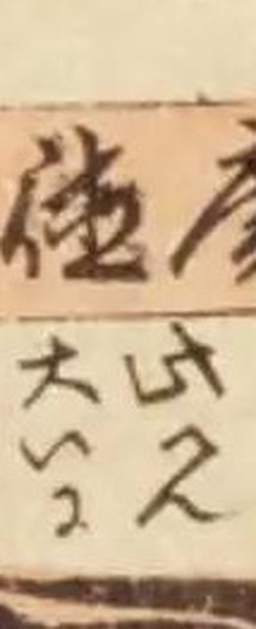大いに
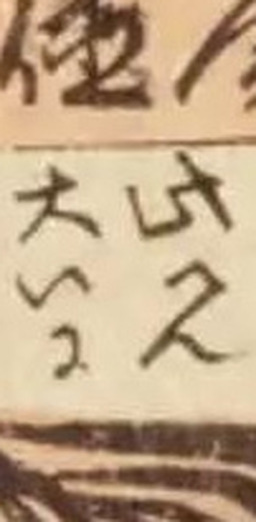大いに
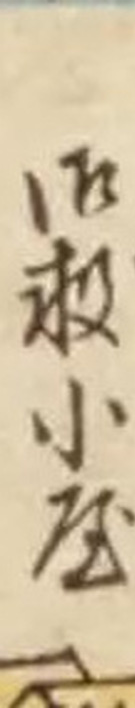御救小屋
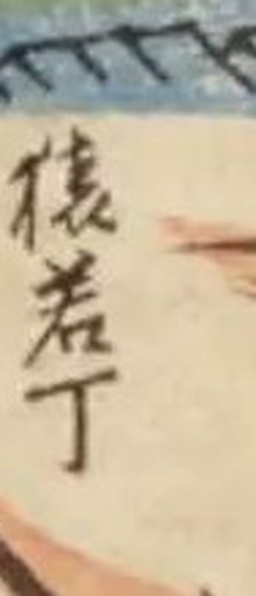猿若丁
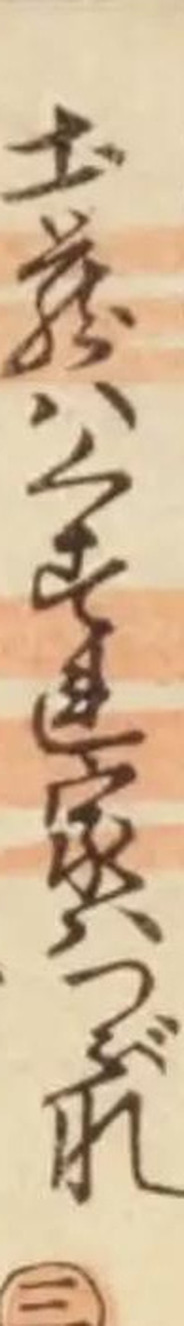土藏はくすれ家はつぶれ
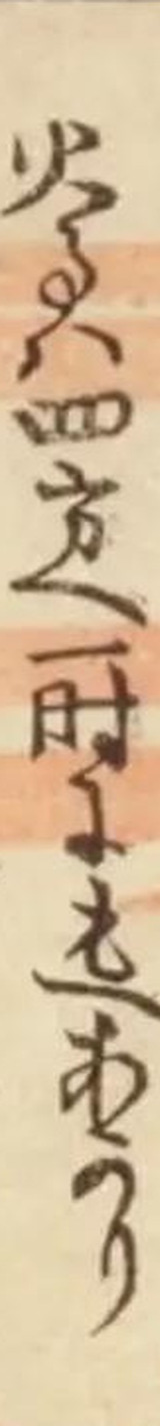火事は四方へ一時にもへあかり
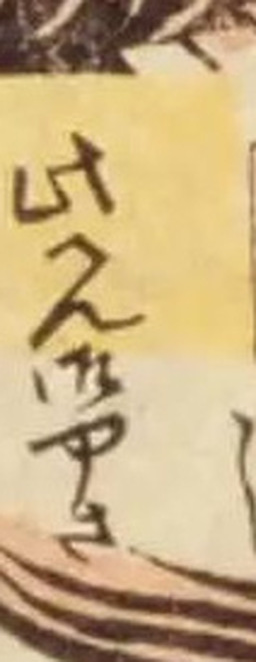此へん御やき
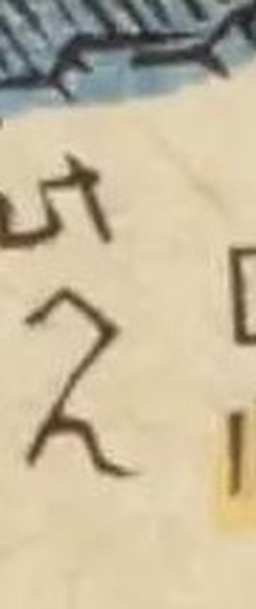此へん
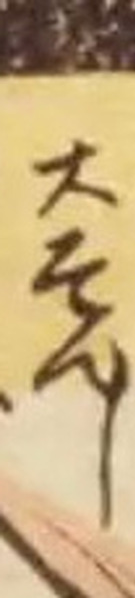大そんじ
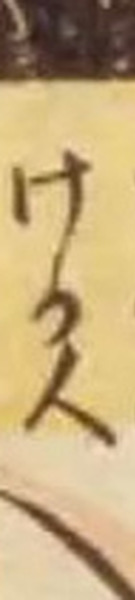けか人
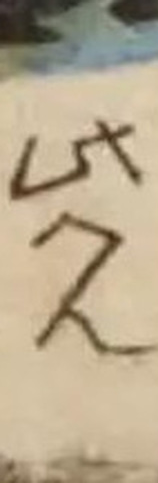此へん
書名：銘細改板江戸大地震出火場所附
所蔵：国立国会図書館 National Diet Library, JAPAN
